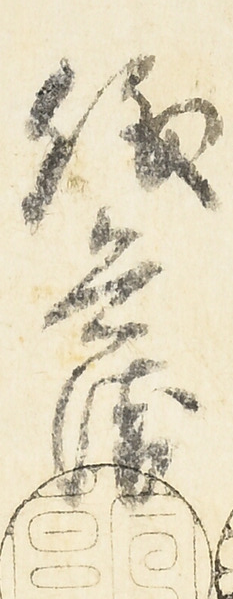勘兵衛
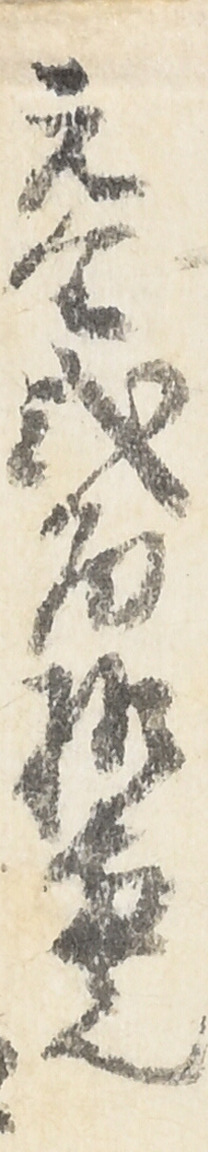元金弐百拾両也
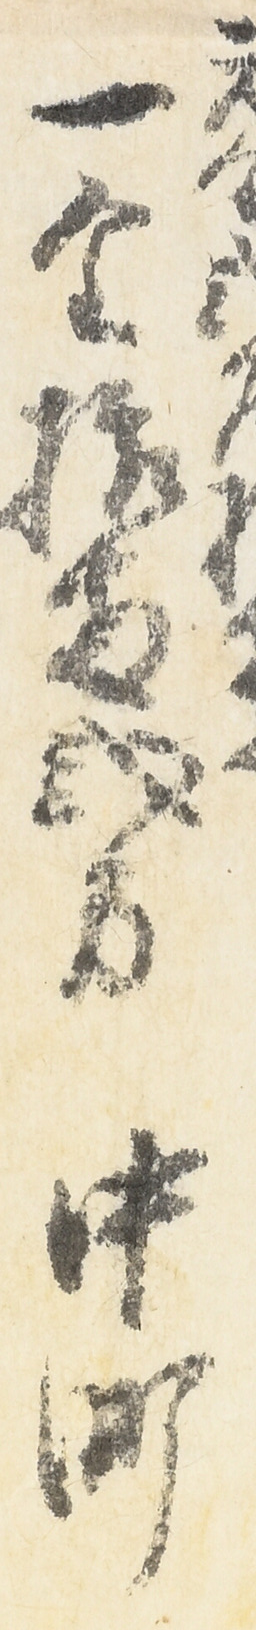一金拾両弐分中町
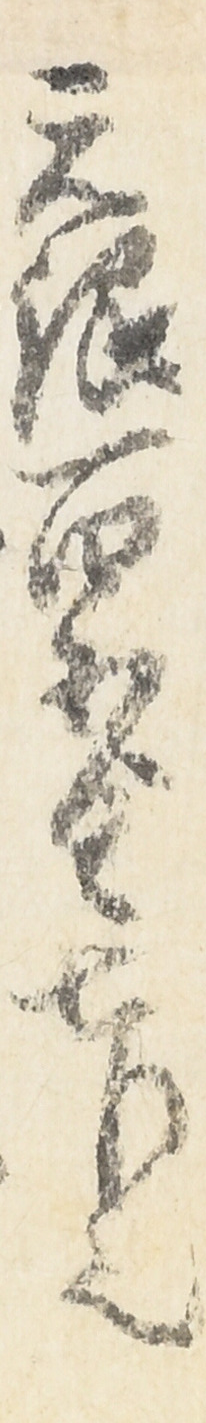元銀百五匁七分也
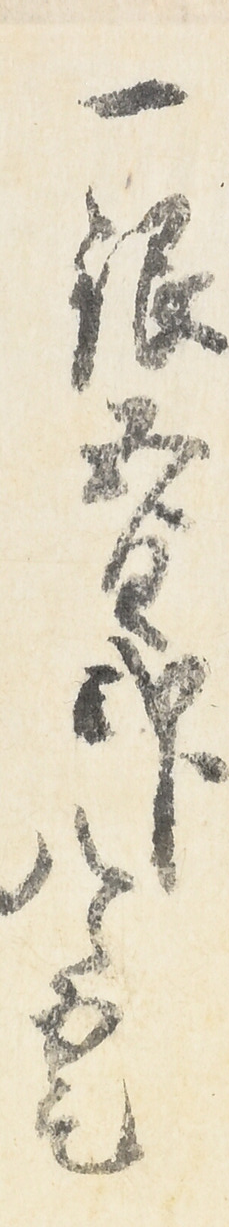銀五匁弐分八厘五毛
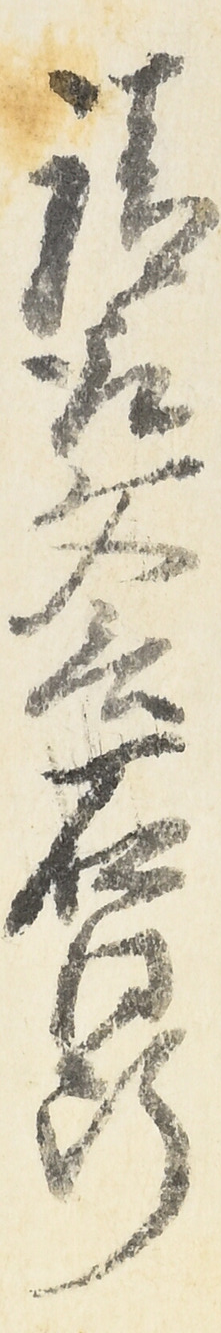請取文言右同断
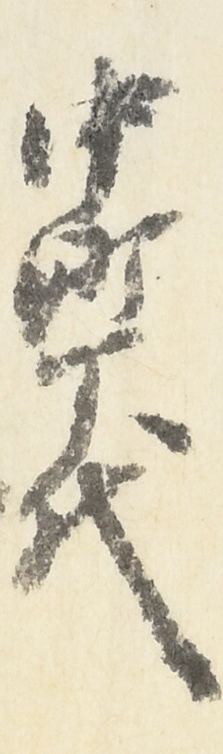中町丁代
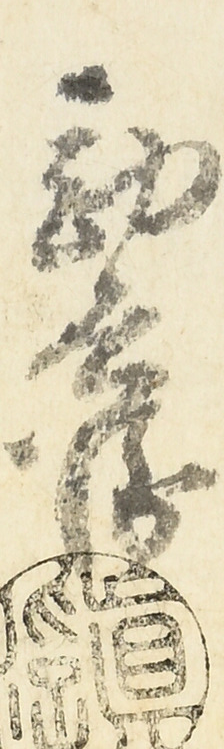勘兵衛

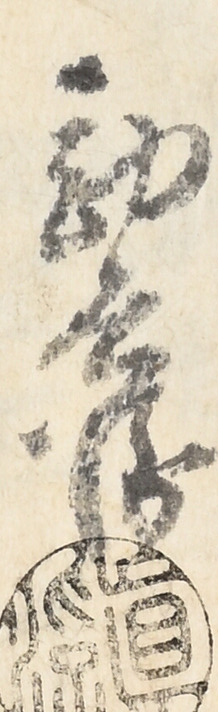吉兵衛
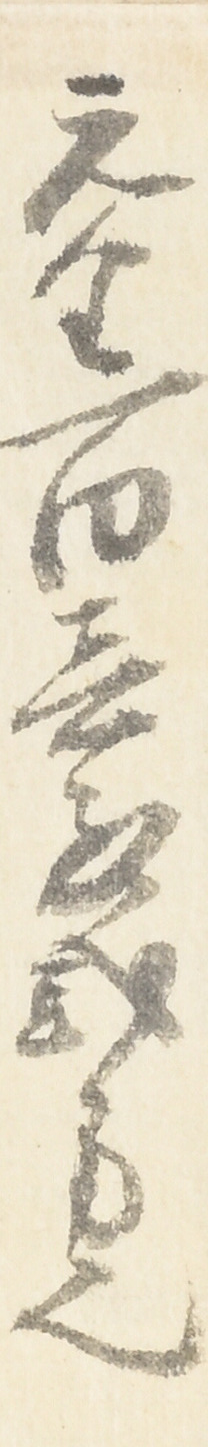元金百壱両弐分也
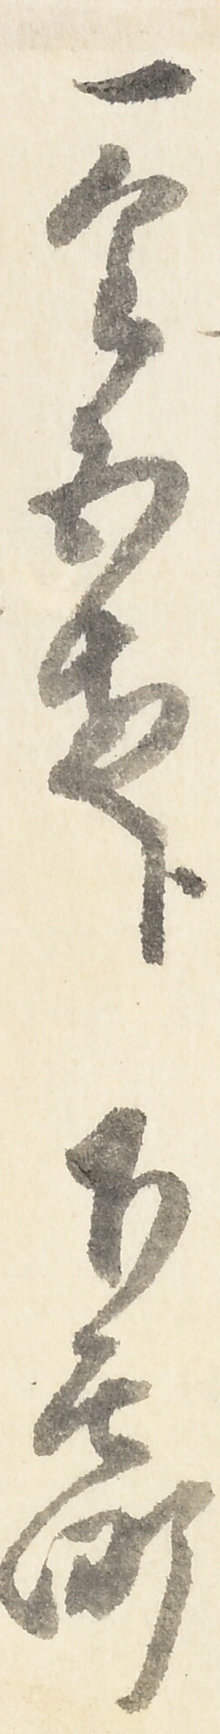一金五両ト下モ町
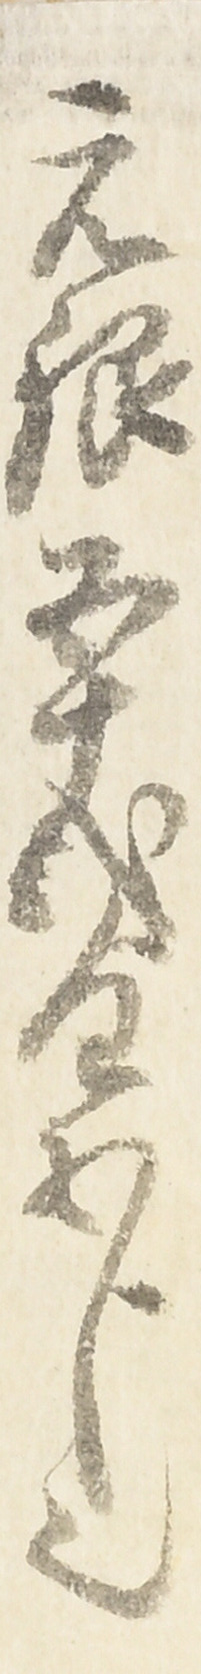元銀五十弐匁五分也
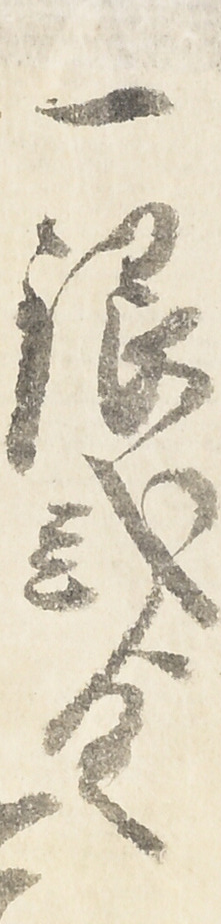一銀弐匁
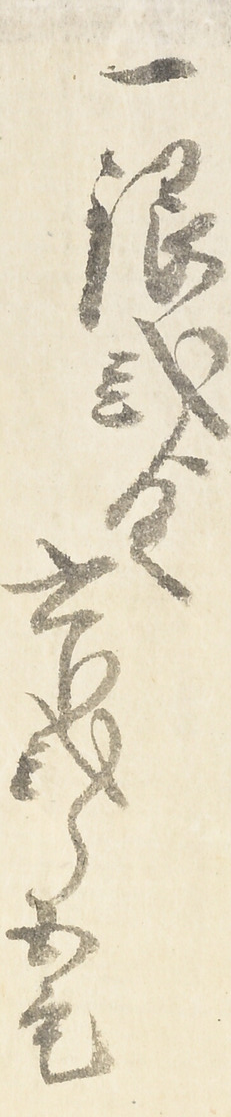一銀弐匁五分弐厘五毛
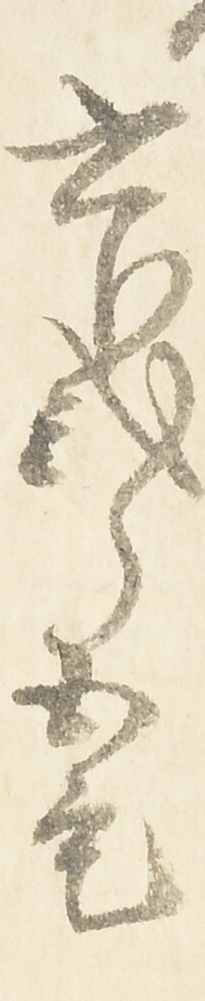六分弐厘五毛
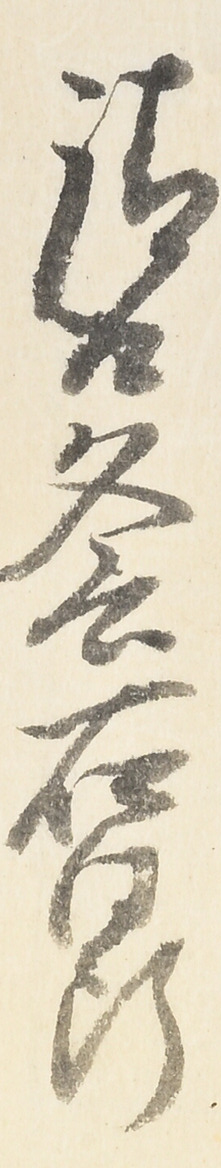請取文言右同断
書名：御才覚金御利足割渡扣帳
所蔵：伊那市立高遠町図書館・合同会社AMANE
